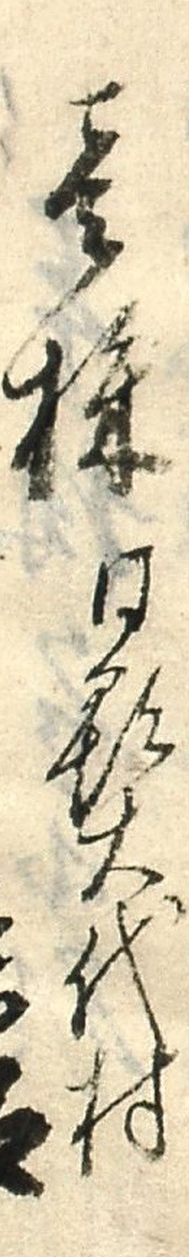壱株同郡大代村
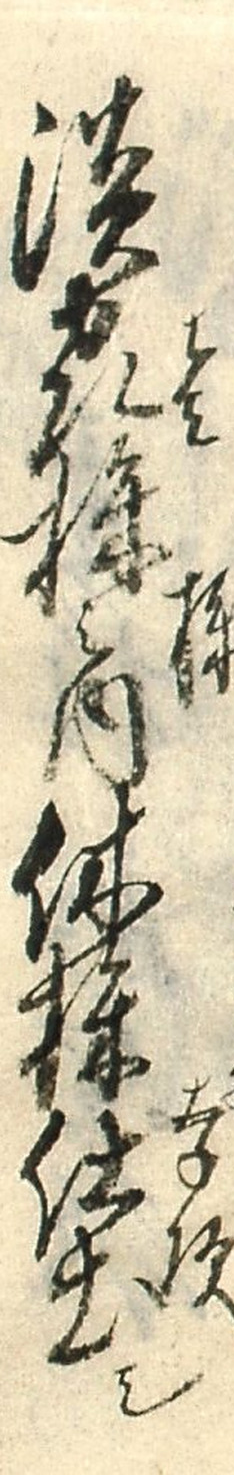淡州株之内休株仕出し
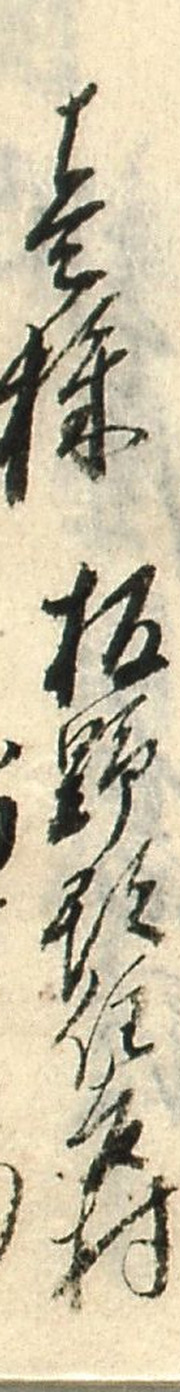壱株板野郡住吉村
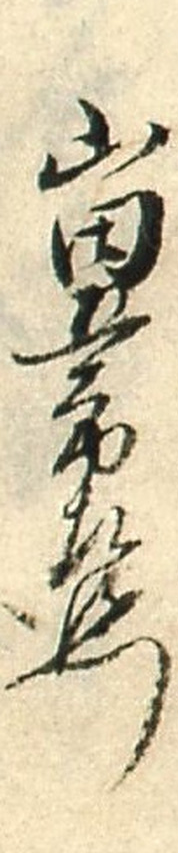山田五郎左衛門
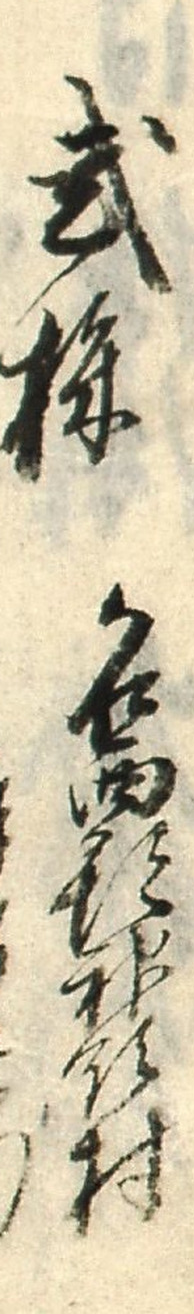壱株名西郡神領村
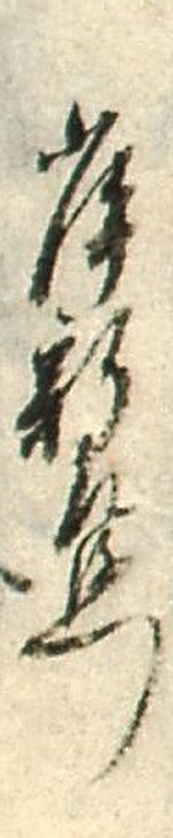岸新左衛門
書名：南北拾郡造酒屋数並株数調子帳
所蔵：鳴門教育大学 Naruto University of Education
